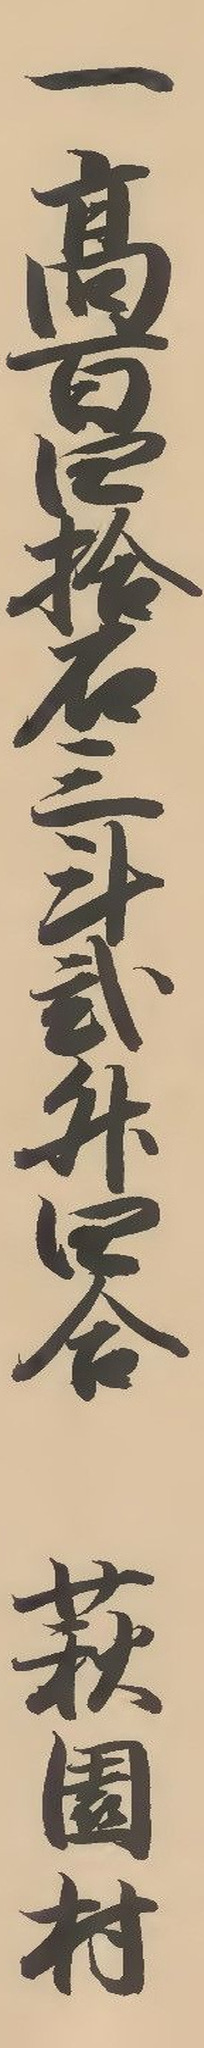一高百四拾石三斗弐升四合萩園村
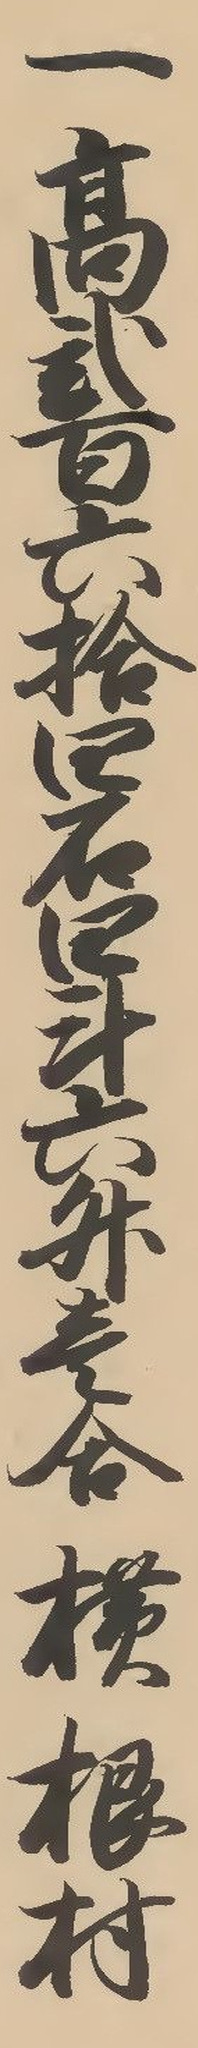一高弐百六拾四石四斗六升壱合横根村
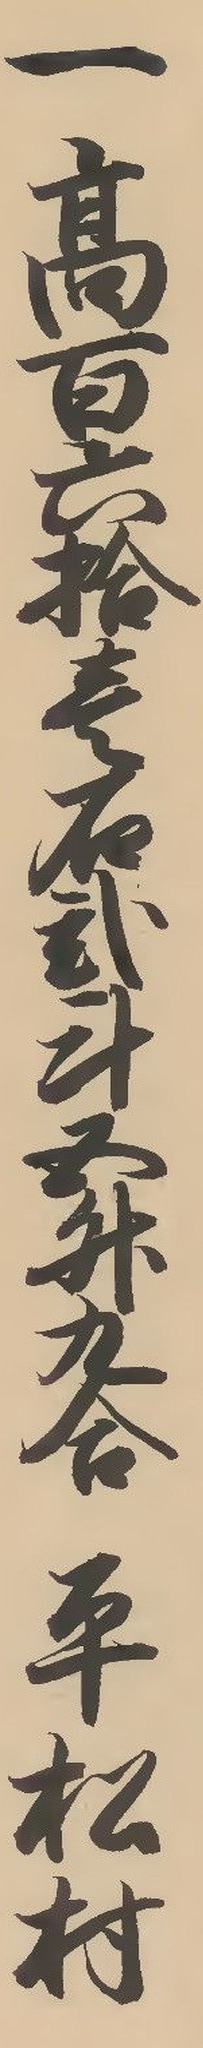一高百六拾壱石弐斗五升九合平松村

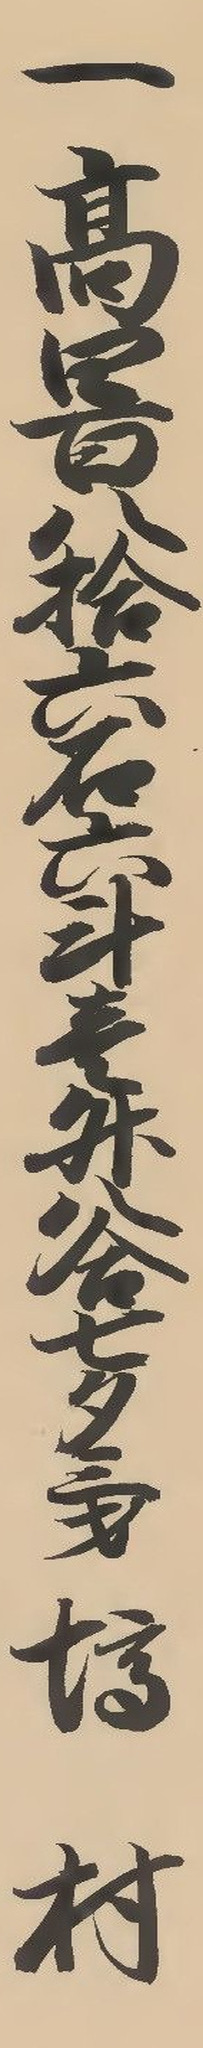一高四百八拾六石六斗壱升八合七勺三才塙村
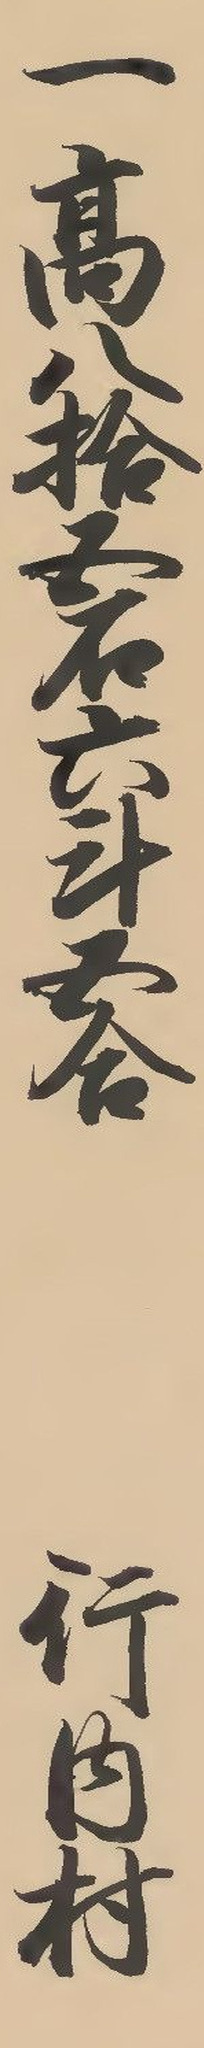一高八拾五石六斗五合行内村
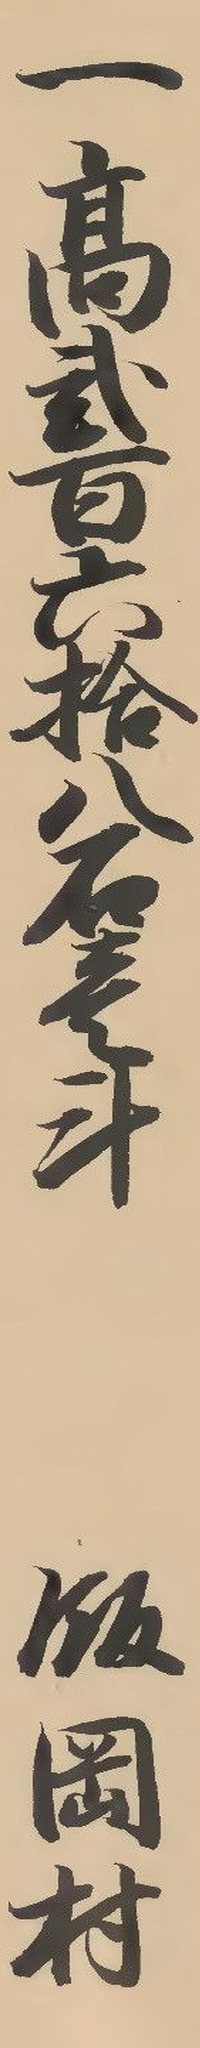一高弐百六拾八石壱斗飯岡村
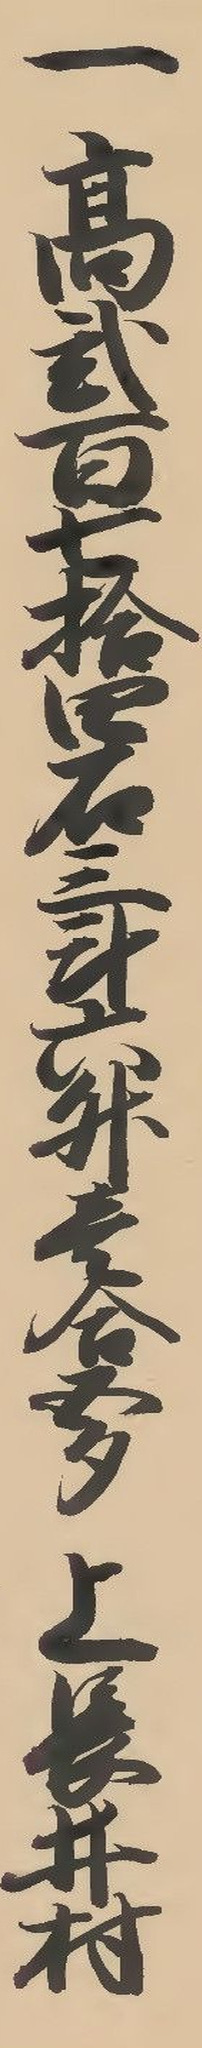一高弐百七拾四石三斗六升壱合五勺上長井村
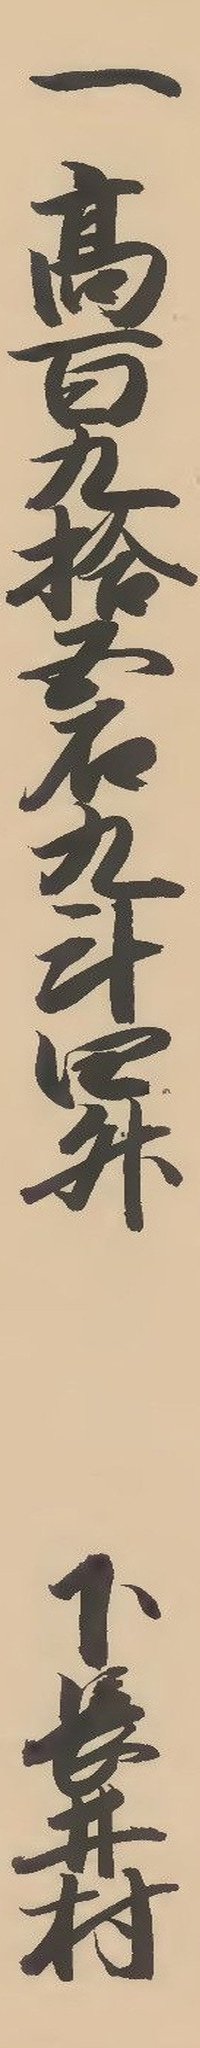一高百九拾五石九斗四升下長井村
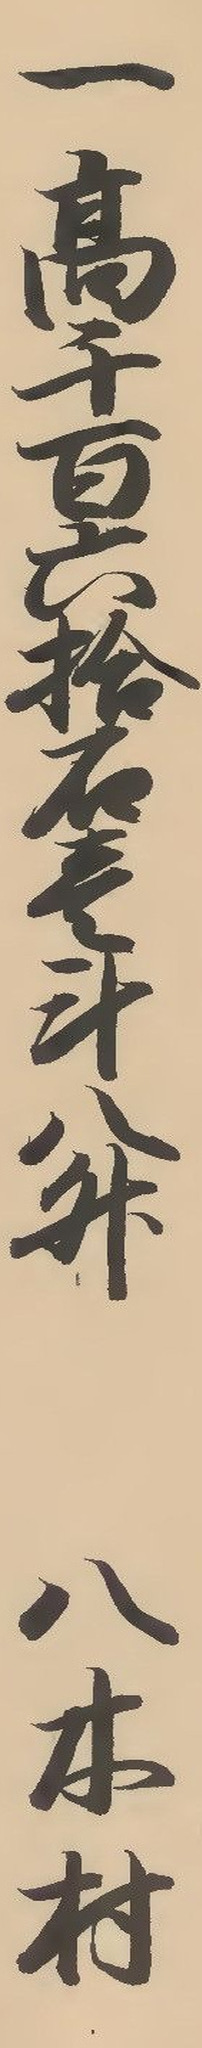一高千百六拾石壱斗八升八木村
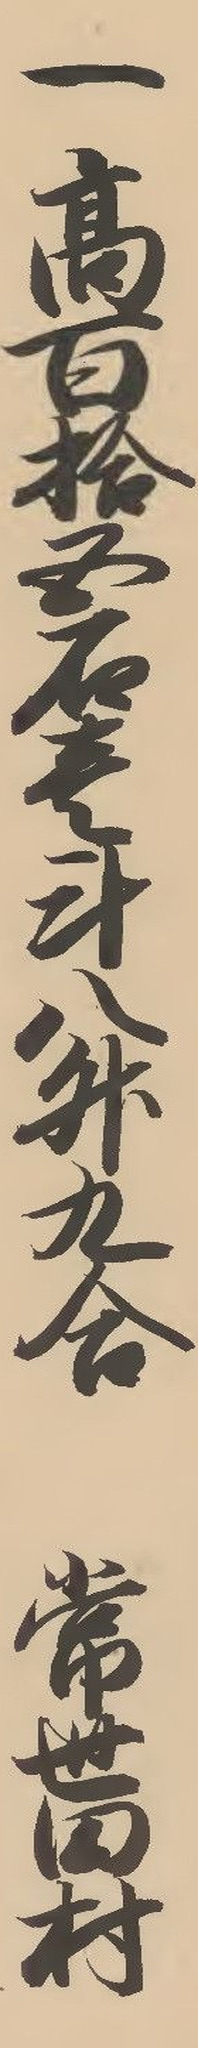一高百拾五石壱斗八升九合常世田村
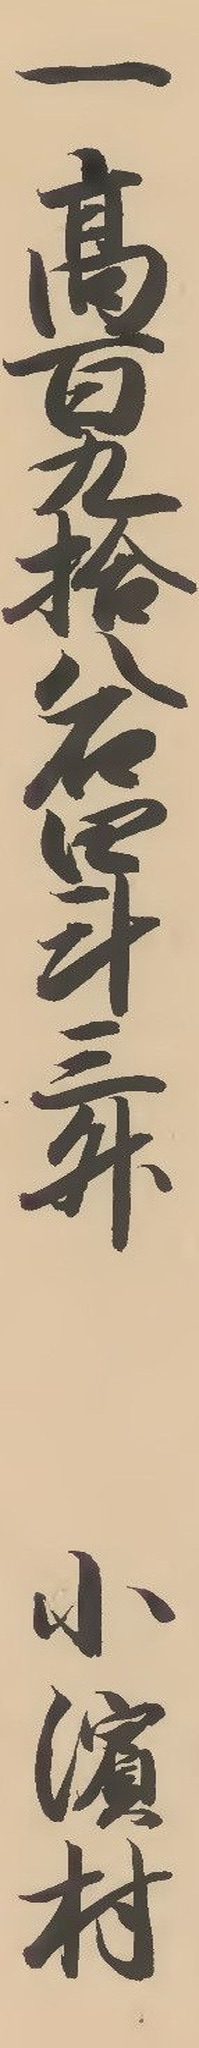一高百九拾八石四斗三升小浜村

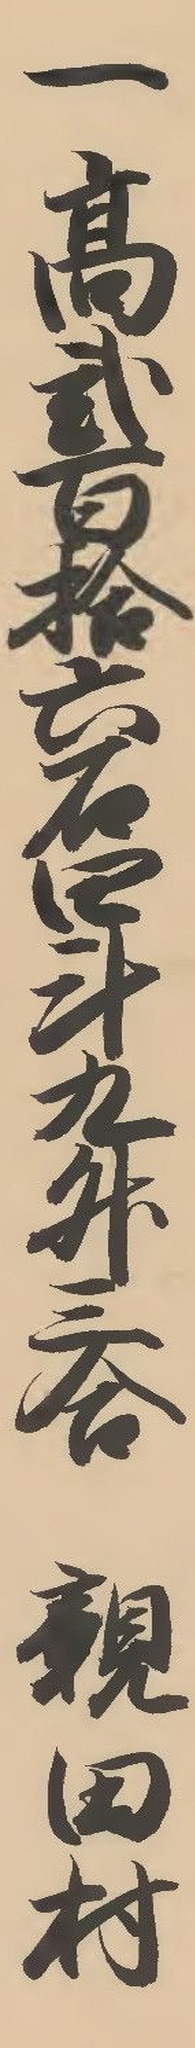一高弐百拾六石四斗九升三合親田村
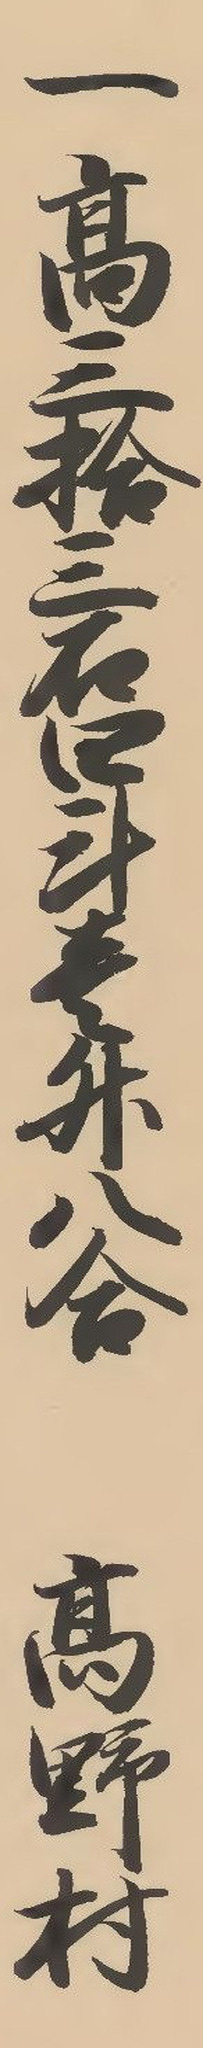一高三拾三石四斗壱升八合高野村
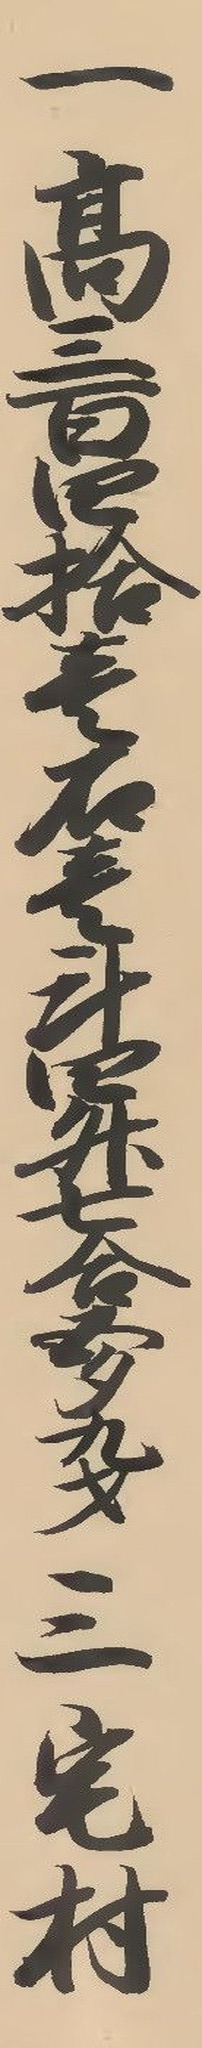一高三百四拾壱石壱斗四升七合五勺九才三宅村
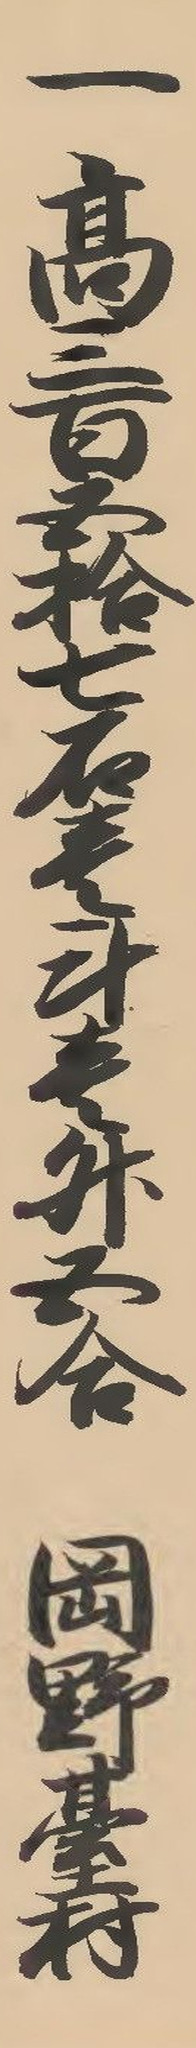一高三百五拾七石壱斗壱升五合岡野台村
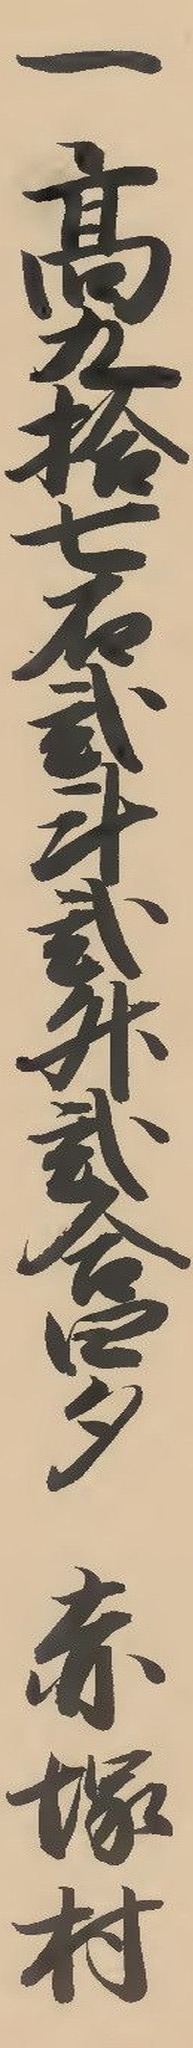一高九拾七石弐斗弐升弐合四勺赤塚村
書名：下総国郷帳
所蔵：国立公文書館 National Archives of Japan
